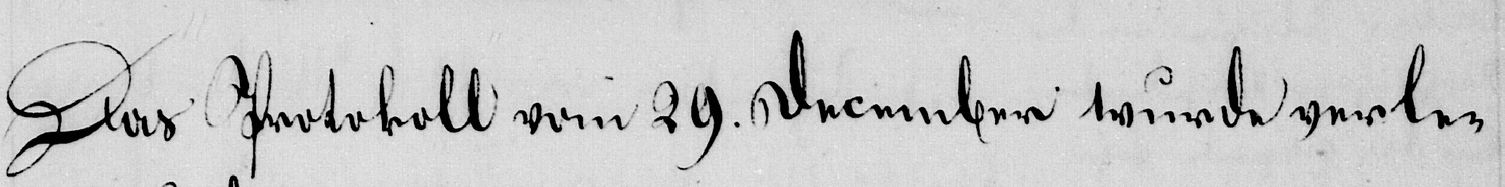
Das Protokoll vom 29. December wurde verle¬
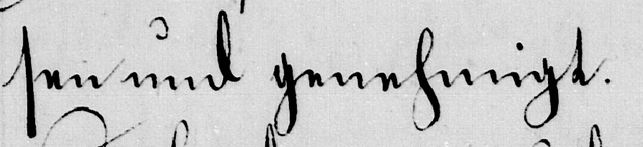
sen und genehmigt.
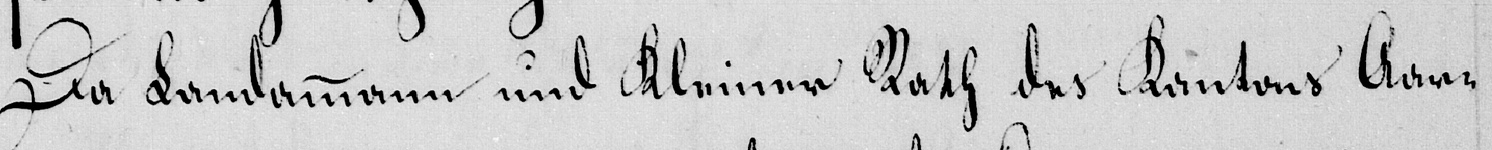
Da Landammann und Kleiner Rath des Kantons Aar¬
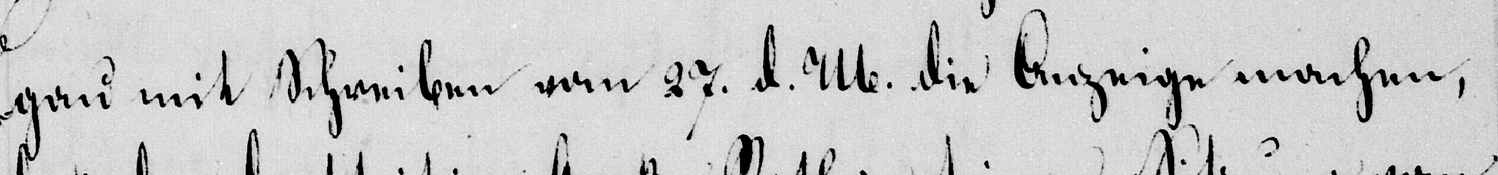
gau mit Schreiben vom 27. d. M. die Anzeige machen,
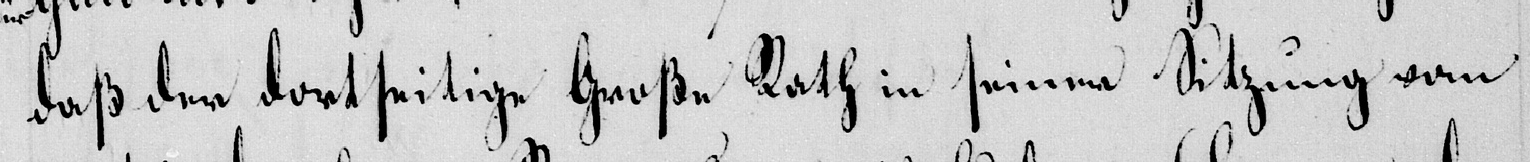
daß der dortseitige Große Rath in seiner Sitzung vom
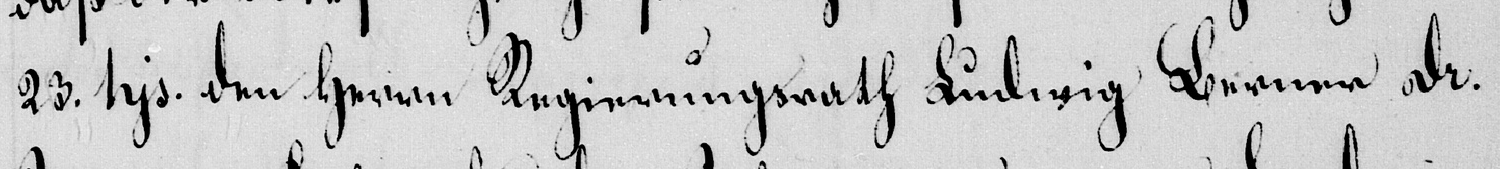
23. hjs. den Herrn Regierungsrath Ludwig Berner Dr.
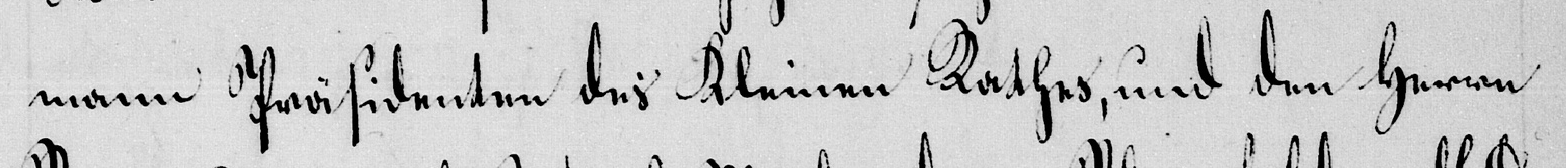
mann Präsidenten des Kleinen Rathes, und den Herrn
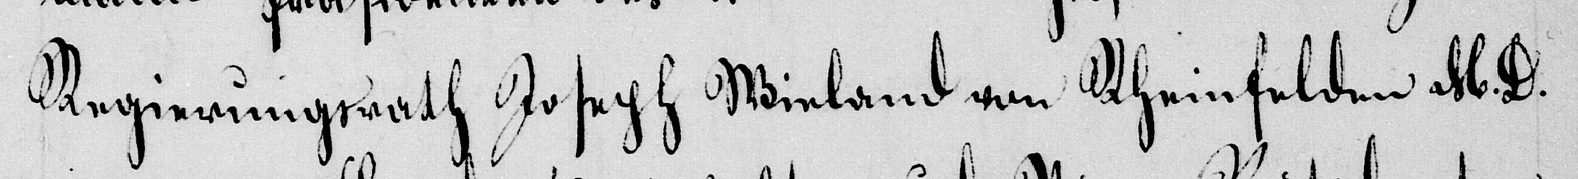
Regierungsrath Joseph Wieland von Rheinfelden M. D.
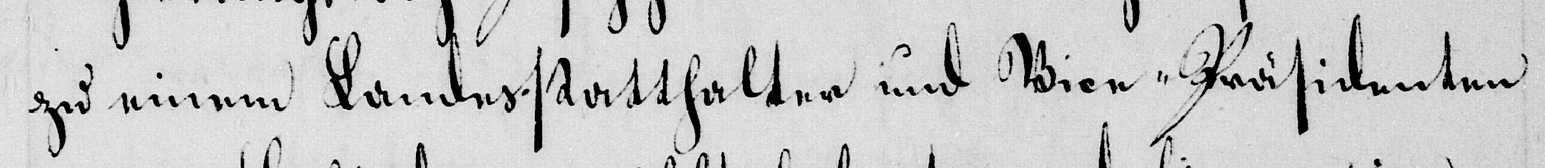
zu einem Landesstatthalter und Vice-Präsidenten
